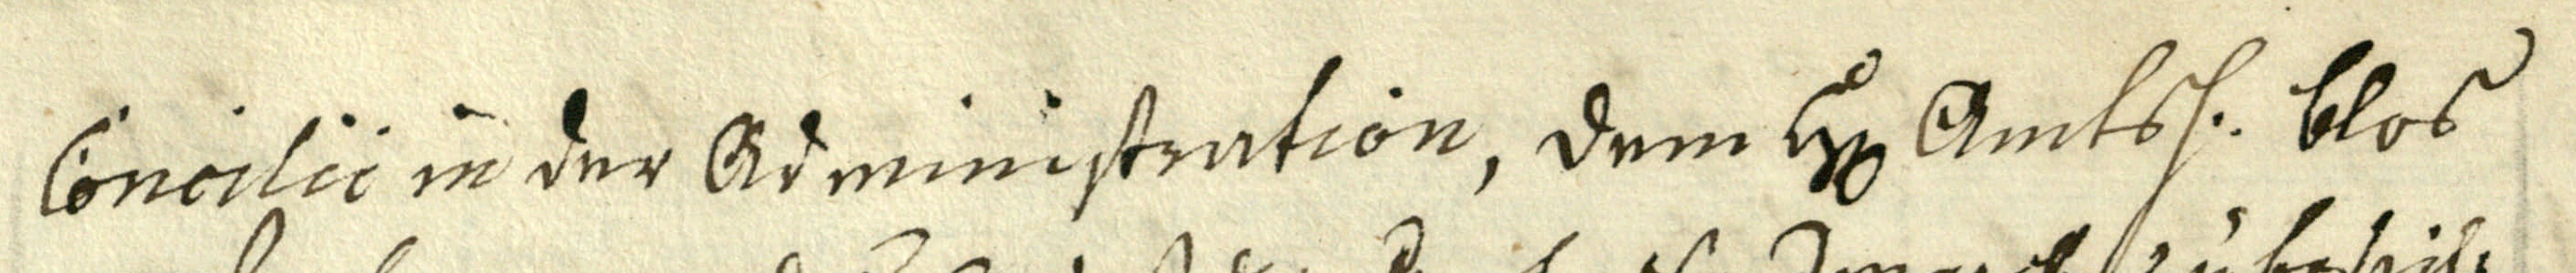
Concilii in der Administration, dem H Amtsh. blos
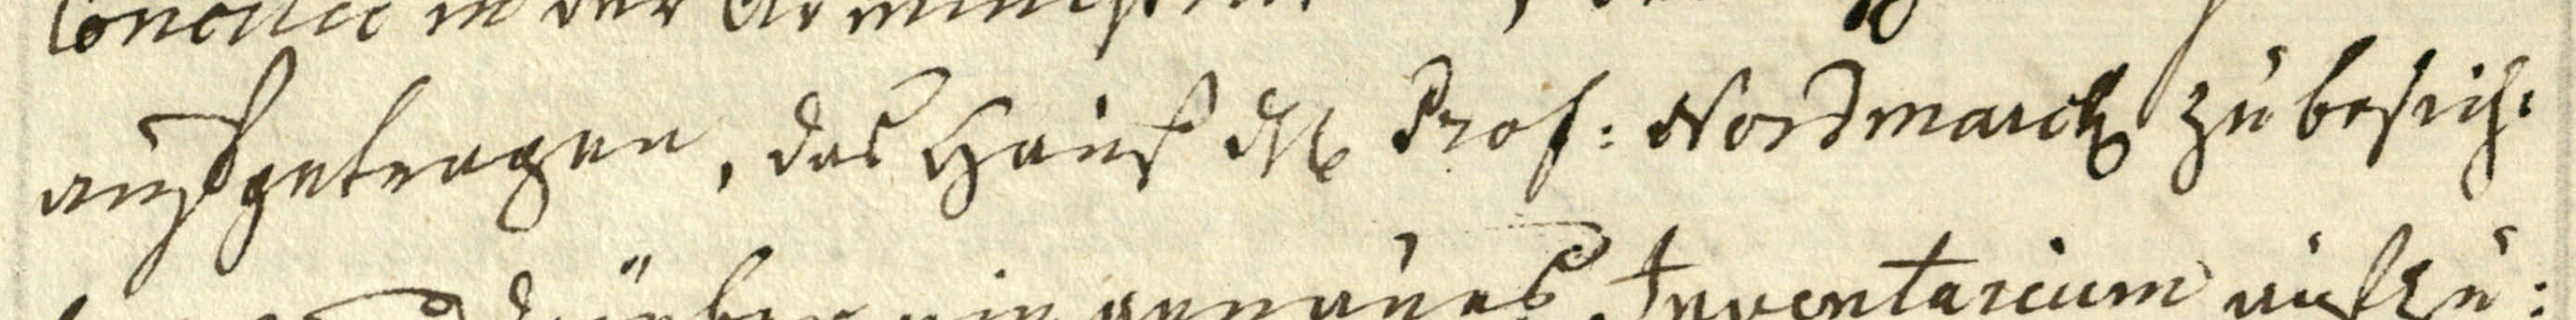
aufgetragen, das Hauß dh Prof. Nordmarck. zu besich¬
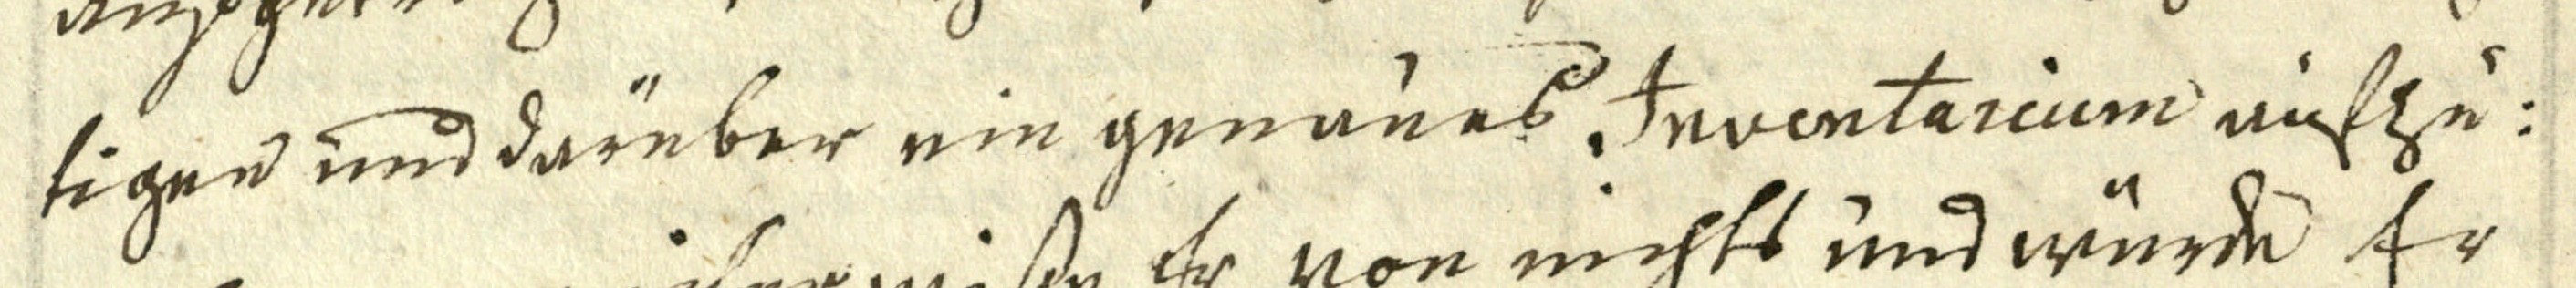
tigen und darüber ein genannt Inventarium aufzu¬
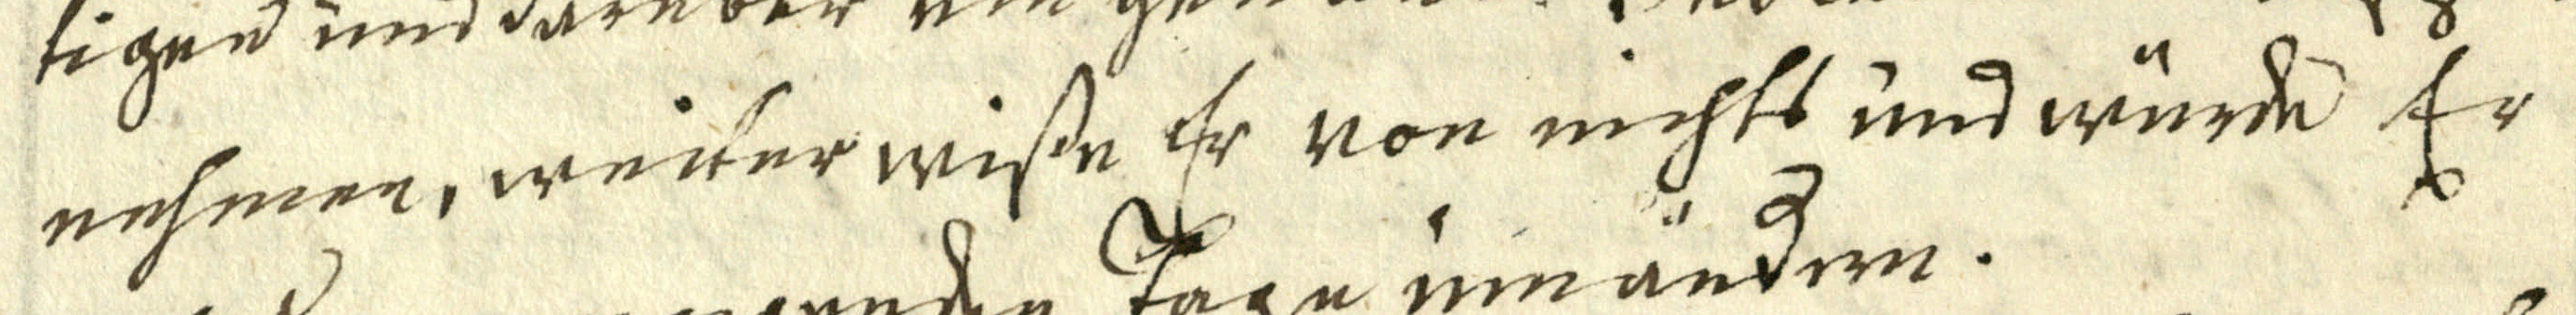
nehmen, weiter wiße Er von nichts und würde Er
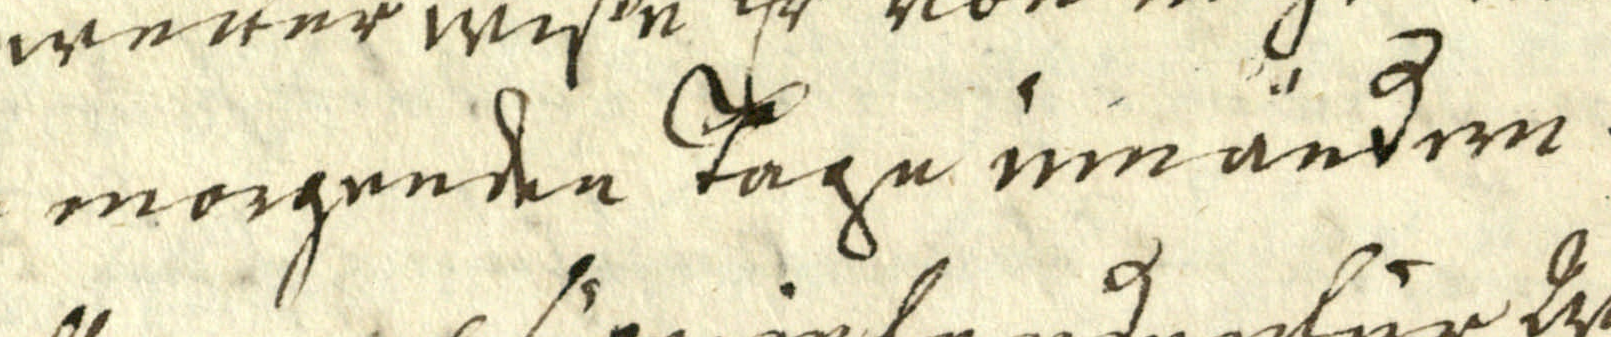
solches am morgenden Tage um ändern.
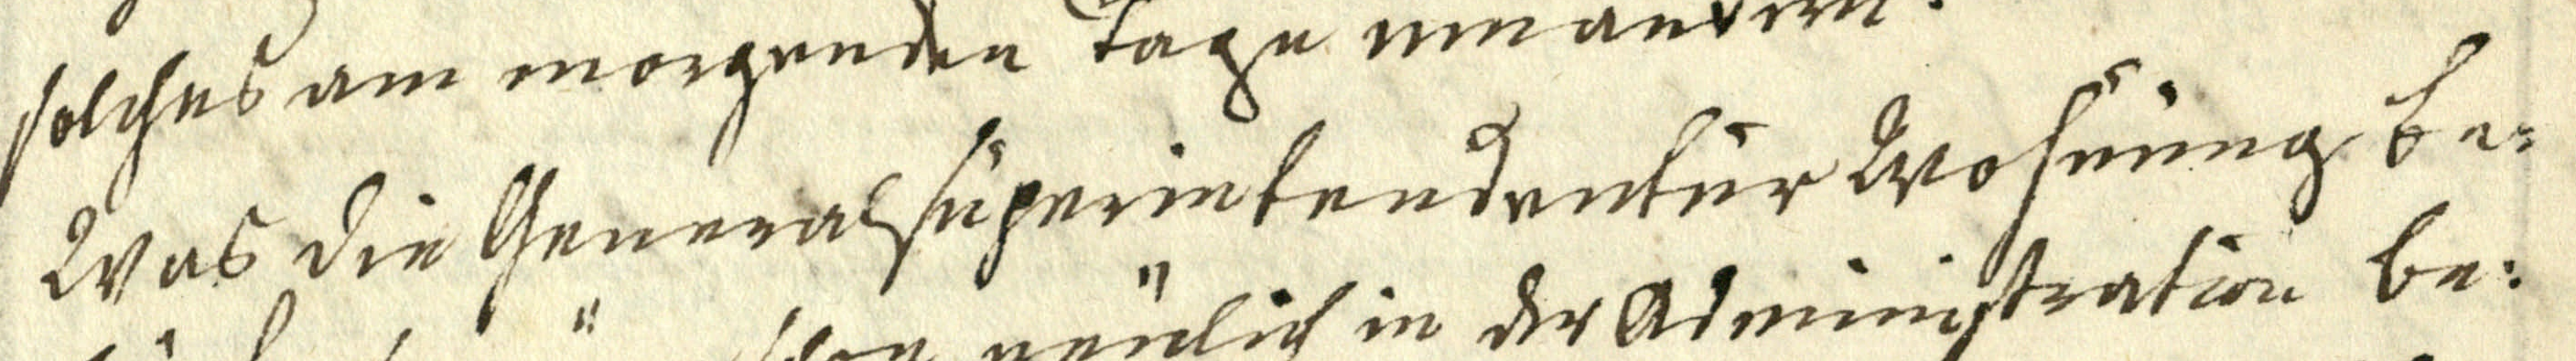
Was die GeneralSuperintendentur Wohnung be¬
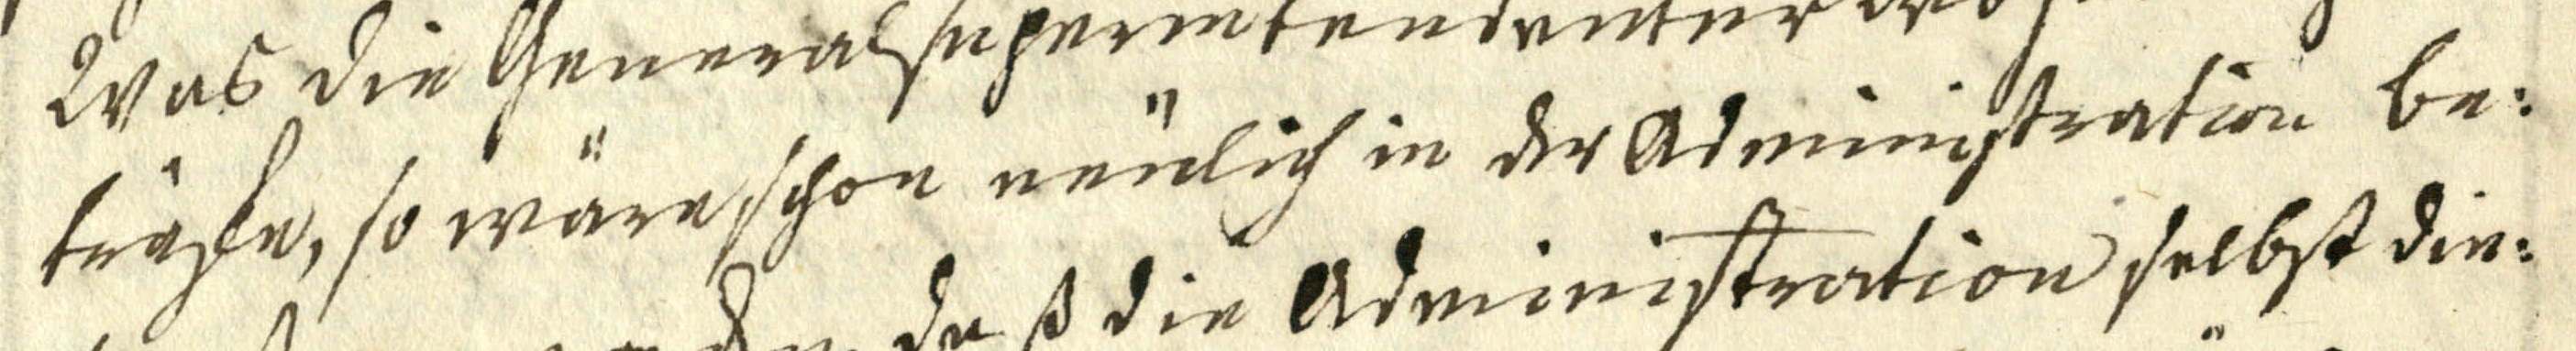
träfe, so wäre schon neulich in der Administration be¬
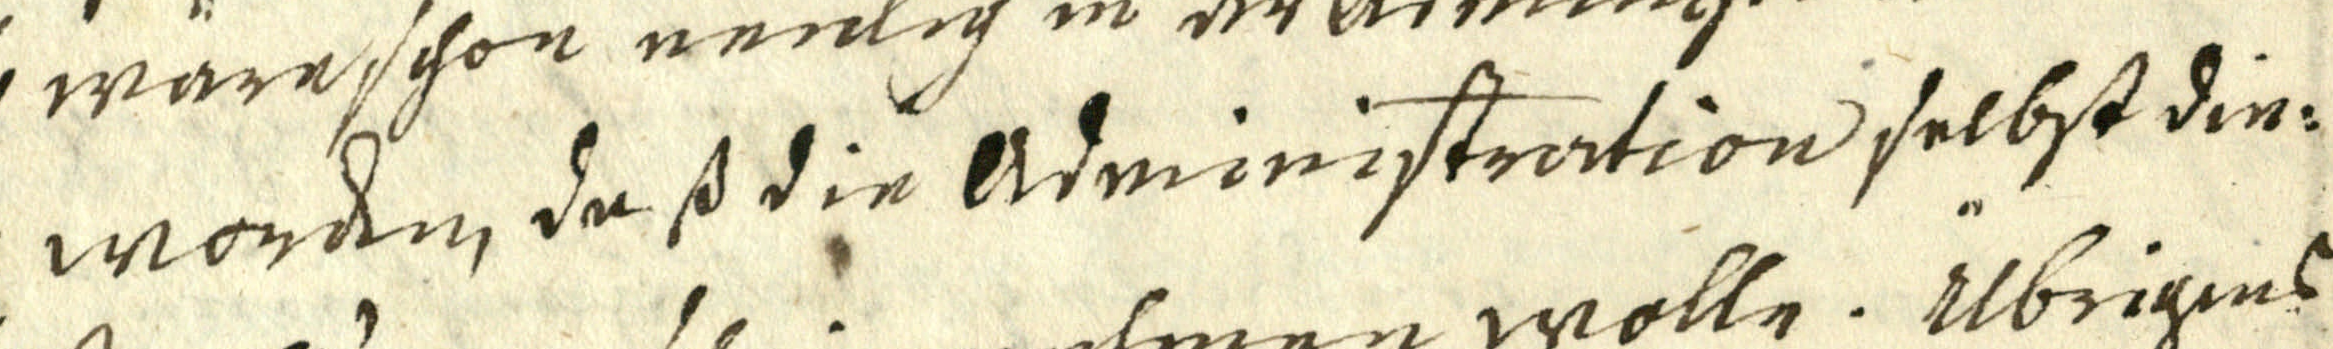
schloßen worden, daß die Administration selbst die¬
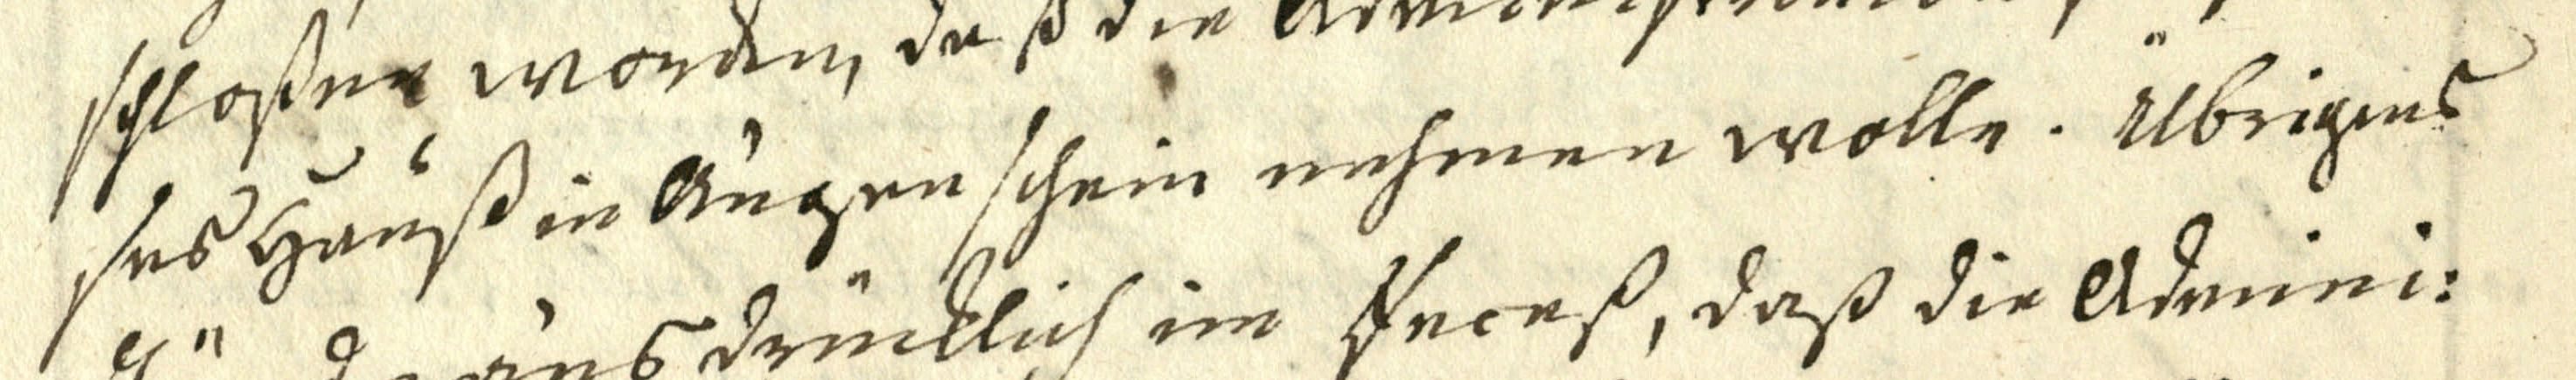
ses Hauß in Augenschein nehmen wolle. Übrigens
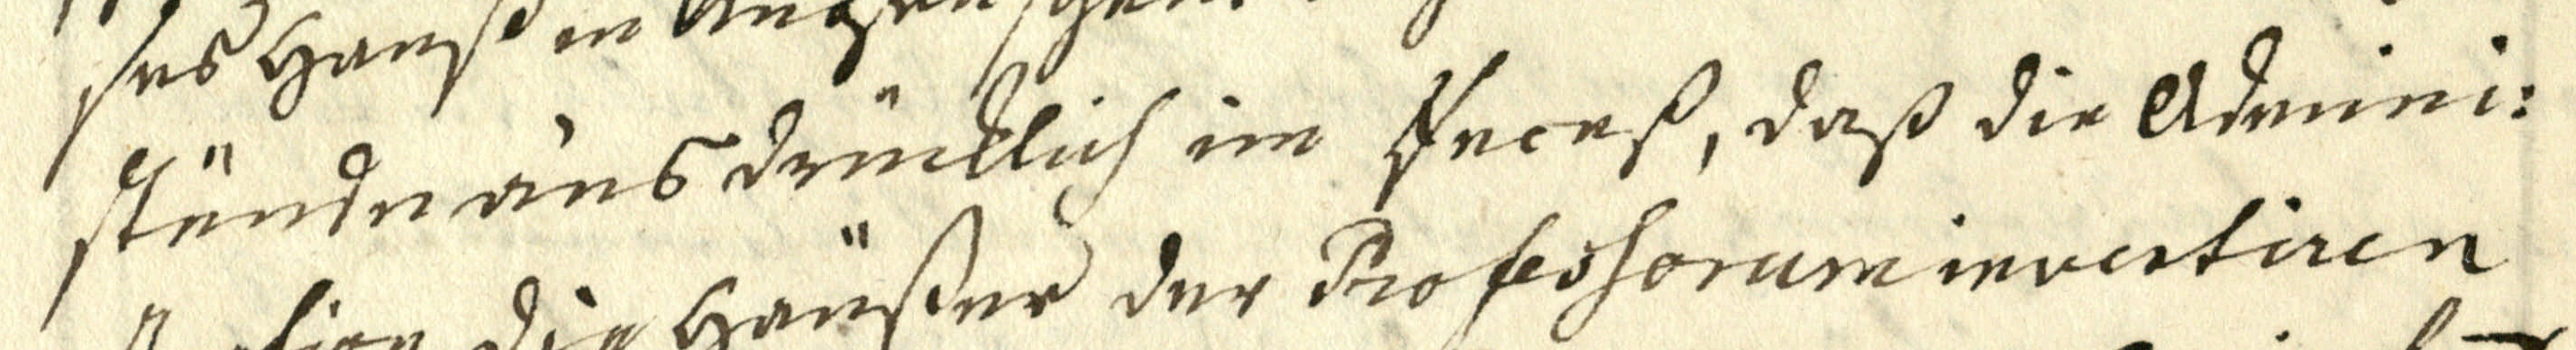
stünde ausdrücklich im Receß, daß die Admini¬
